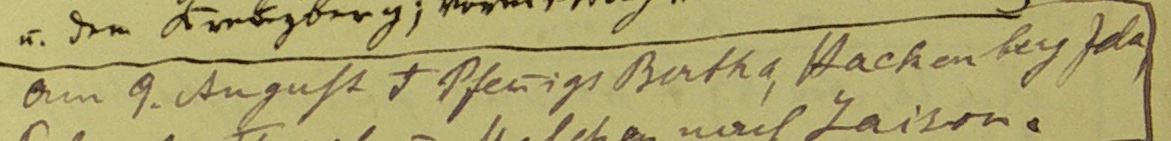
Am 9. Aug. mit Pfenniges Bertha , Hackenberg Ida ,
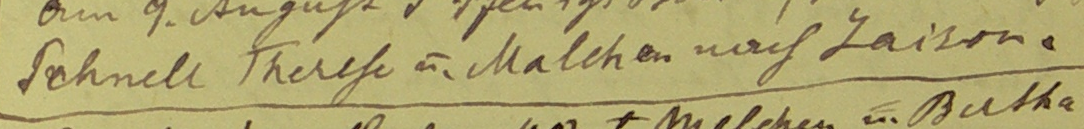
Schnell Therese und Malchen nach Zaizon.
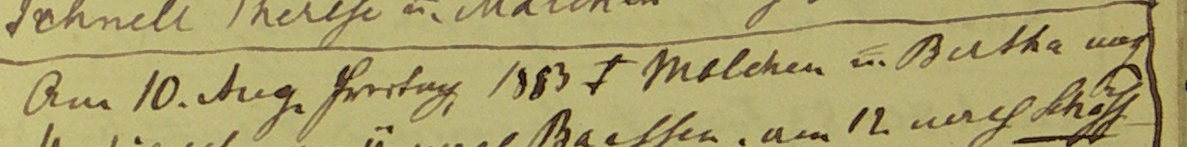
Am 10. Aug. Freitag 1883. Mit Malchenund Bertha nach
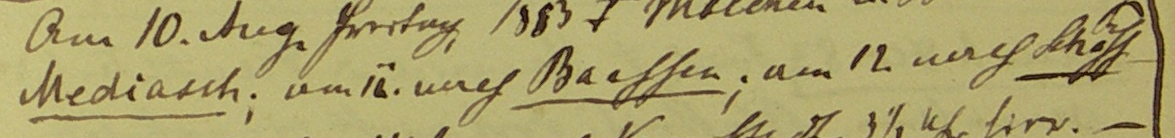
Mediassch; am 11. Nach Baassen; am 12. Nach Schäss¬
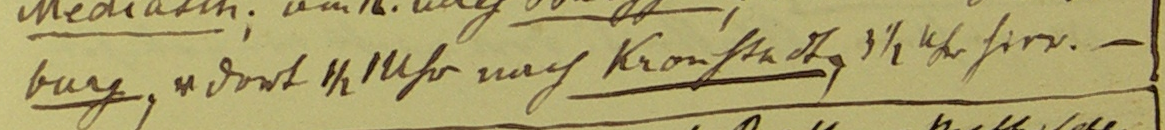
burg, von dort 1/2 1 Uhr nach Kronstadt. 3 ½ Uhr hier.—
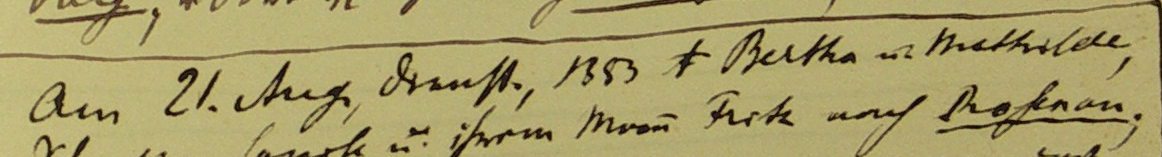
Am 21. Aug. Dienstag.,1883 mit Bertha und Mathilde,
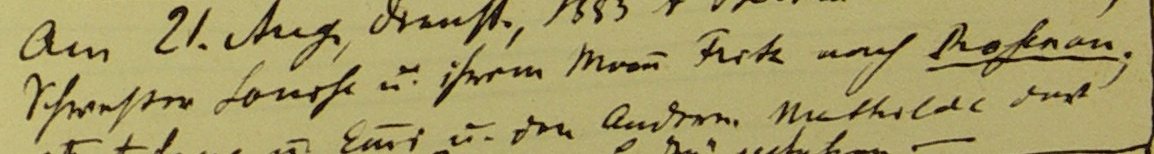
Schwester Louise und ihrem Mann Fritz nach Prohnan.
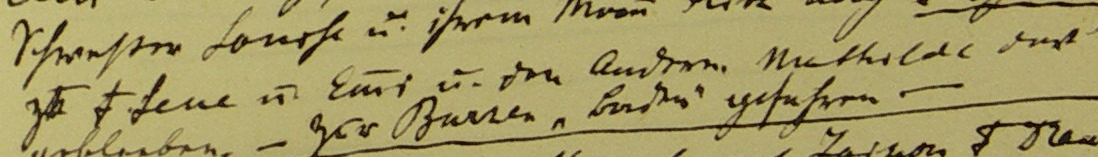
zusammen mit Lene und Emma und den Anderen. Mathilde dort
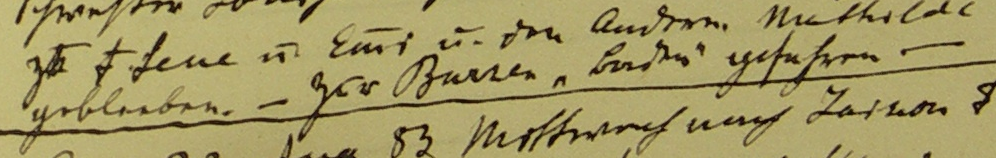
geblieben. Zur Burzen „Baden“ gefahren.-
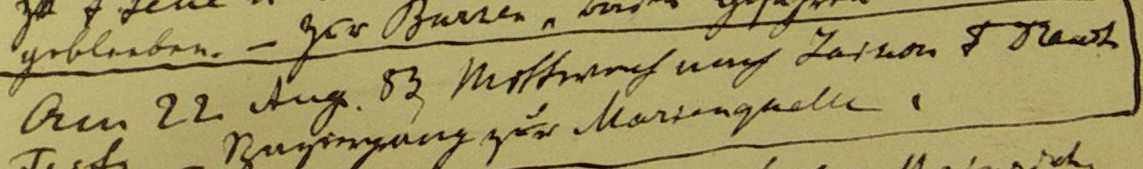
Am 22 Aug. (3, Mittwoch nach Zaizon mit Draudt
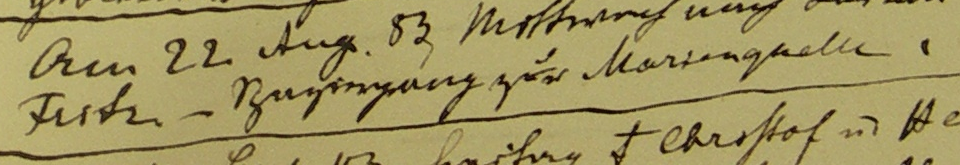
Fritz-Spaziergang zur Marienquelle.
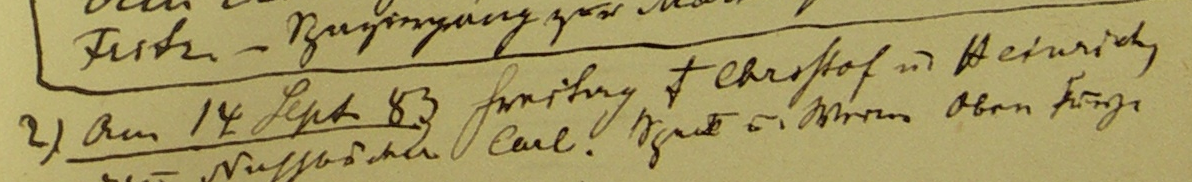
2) Am 14. Sept. 83. Freitag mit Christof und Heinrich
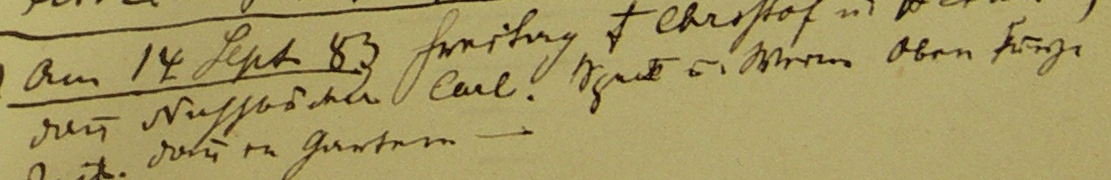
dann Nussbächer Carl. Speck und Wein. Oben kurze
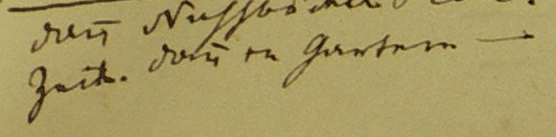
Zeit. Dann im Garten.--
